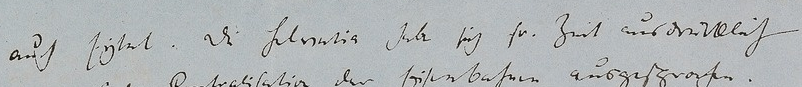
auch Eytel. Die Helvetia habe sich sr. Zeit ausdrücklich
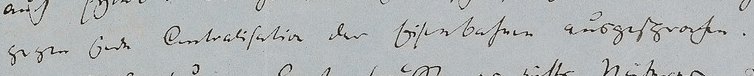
gegen jede Centralisation der Eisenbahnen ausgesprochen.
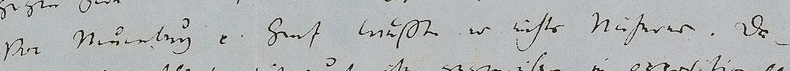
Von Neuenburg &. Genf wüßte er nichts Näheres. Da-
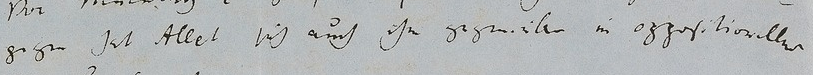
gegen hat Allet sich auch ihm gegenüber in oppositioneller
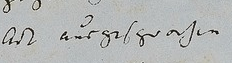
Art ausgesprochen.
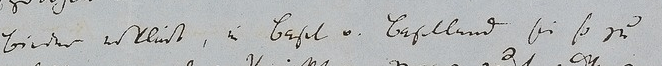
Bieder erklärt, in Basel &. Baselland sei so zu
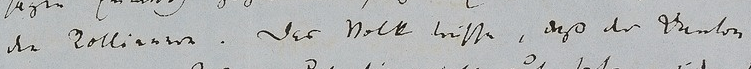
den Rollianern. Das Volk wisse, daß der Kanton
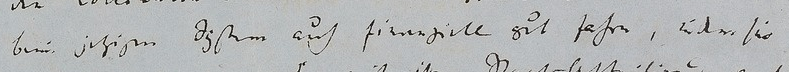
beim jetzigen System auch finanziell gut fahre, indem sie
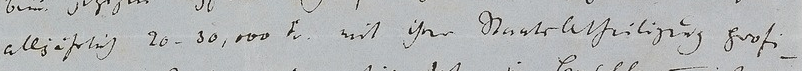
alljährlich 20–30,000 Fr. mit ihrer Staatsbetheiligung profi-
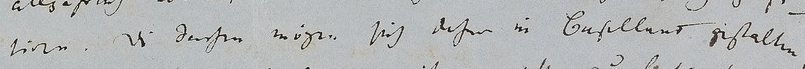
tiren. Die Sachen mögen sich daher in Baselland gestalten,
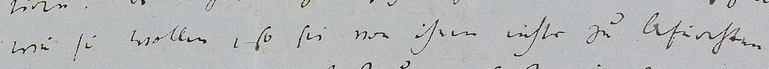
wie sie wollen, so sei von ihnen nichts zu befürchten.
